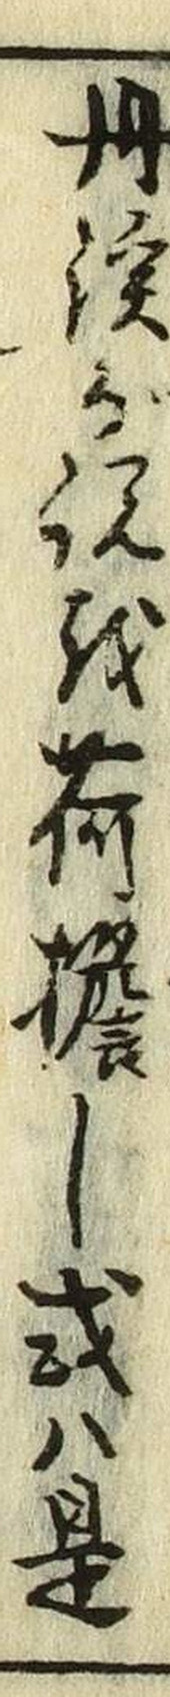丹渓が説を荷担し或は是
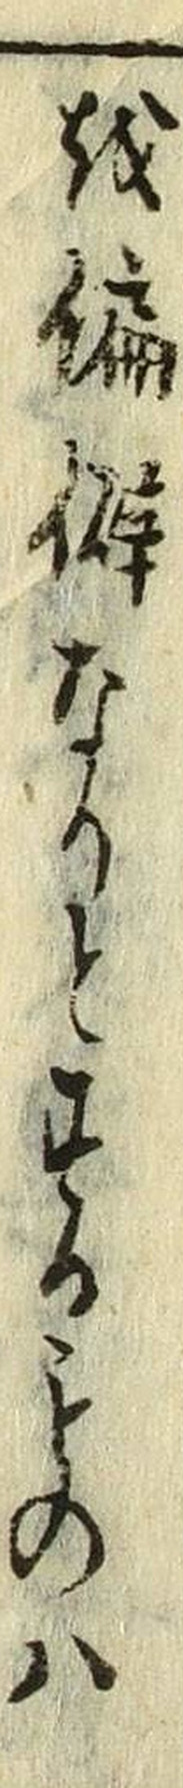を偏僻なりとするものは
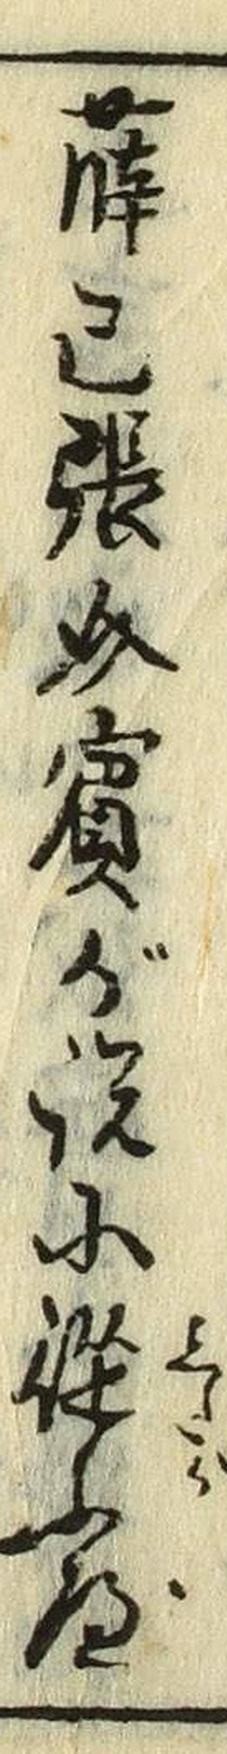薛己張介賓が説に従ふべ
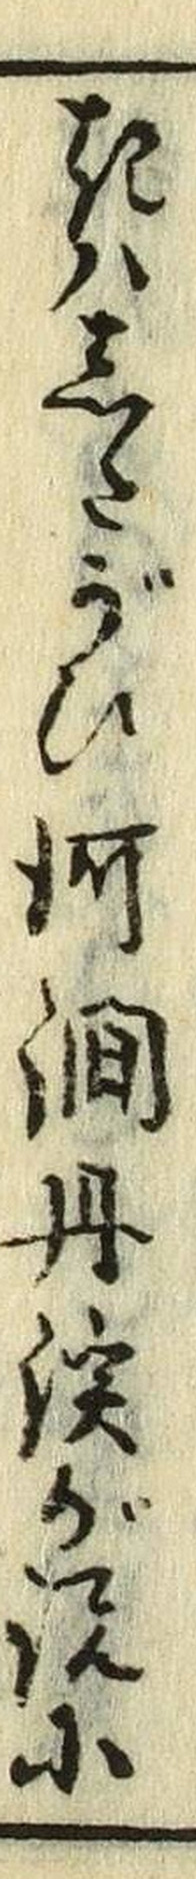きはしたがひ河㵎丹渓が説に
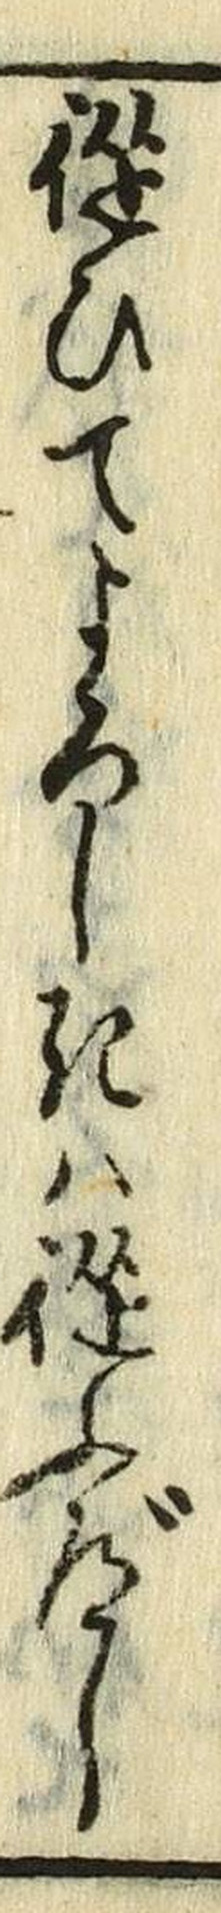従ひてよろしきは従ふべし
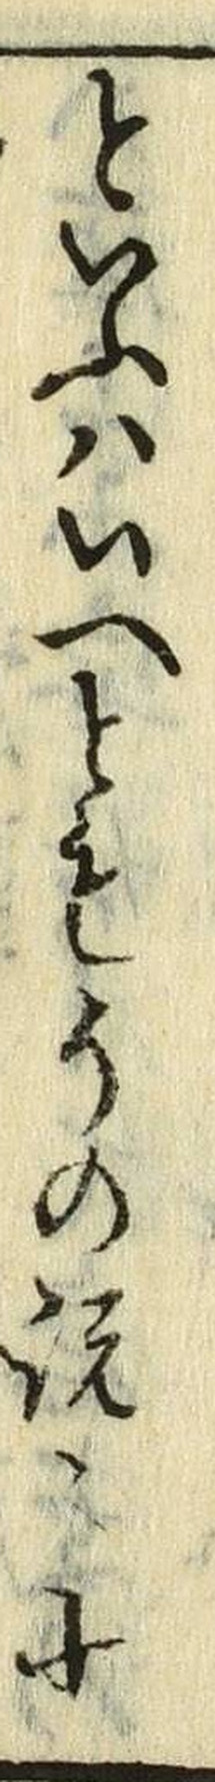といふはいへともその説に
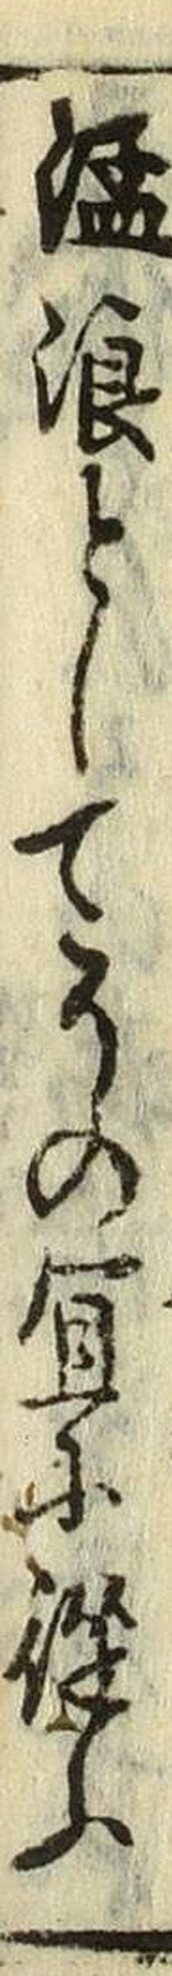猛浪としてその宜に従ふ
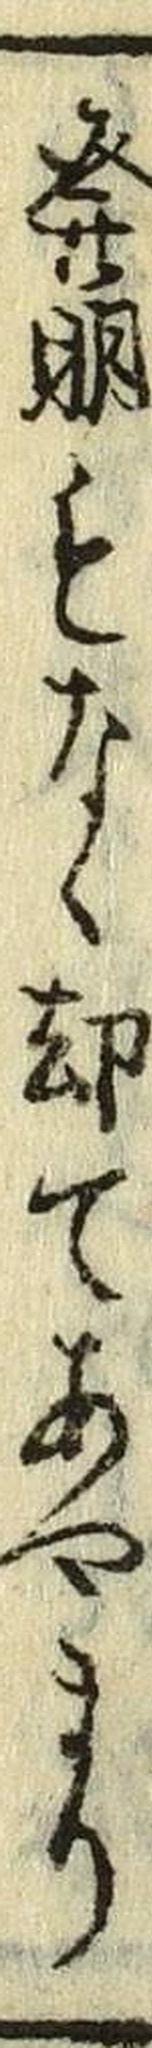発明もなく却てあやまり
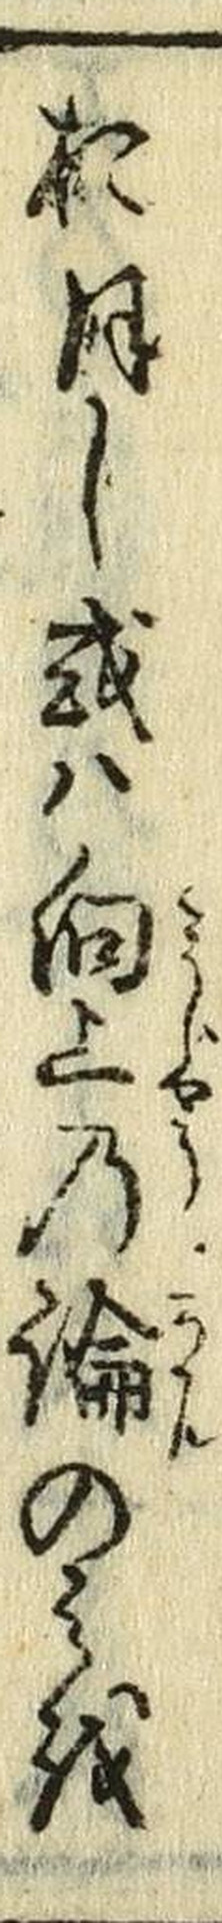おほし或は向上の論のみを
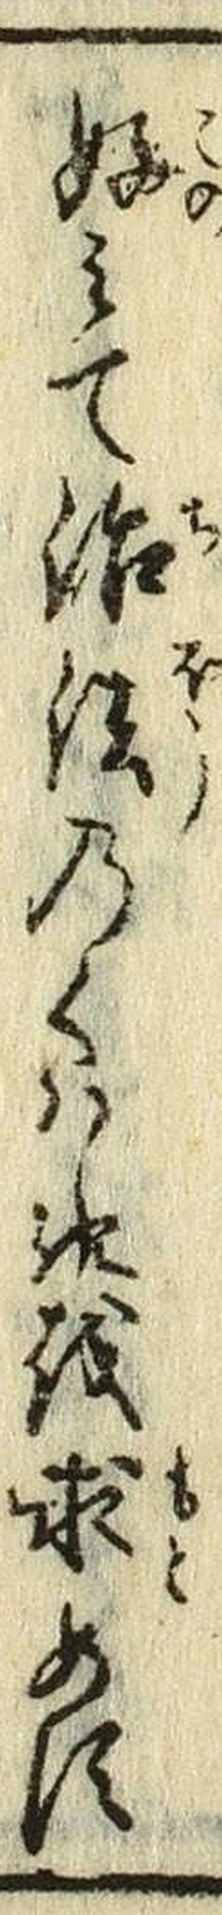好みて治法のくはしきを求めす
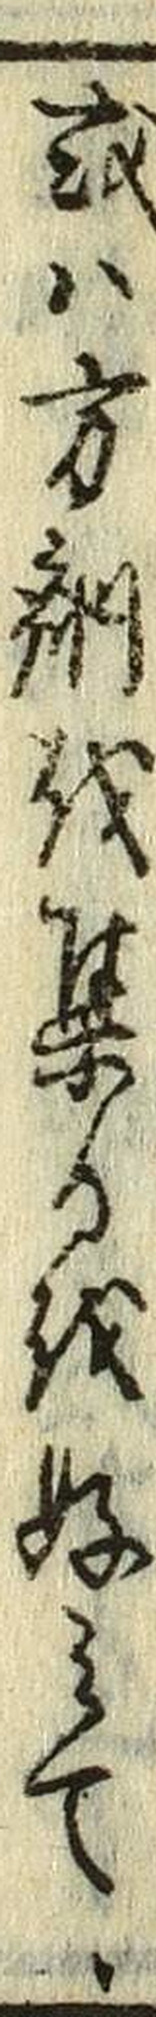或は方剤を集るを好みて
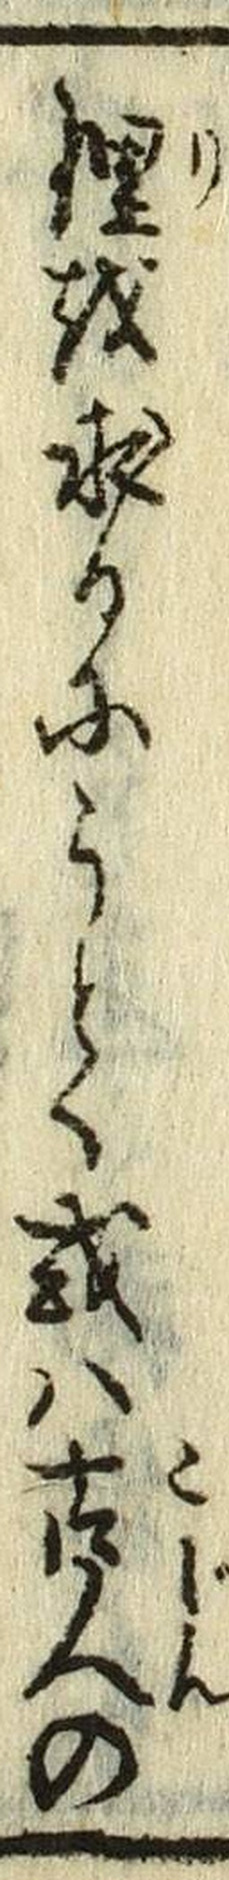理を求るにうとく或は古人の
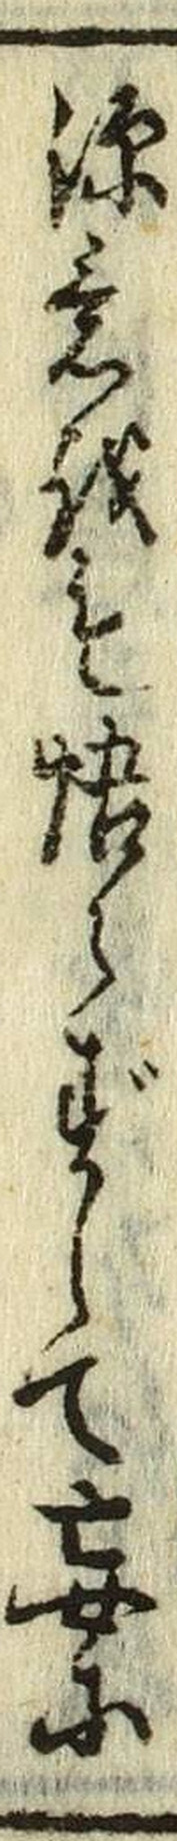深意をも悟らずして妄に
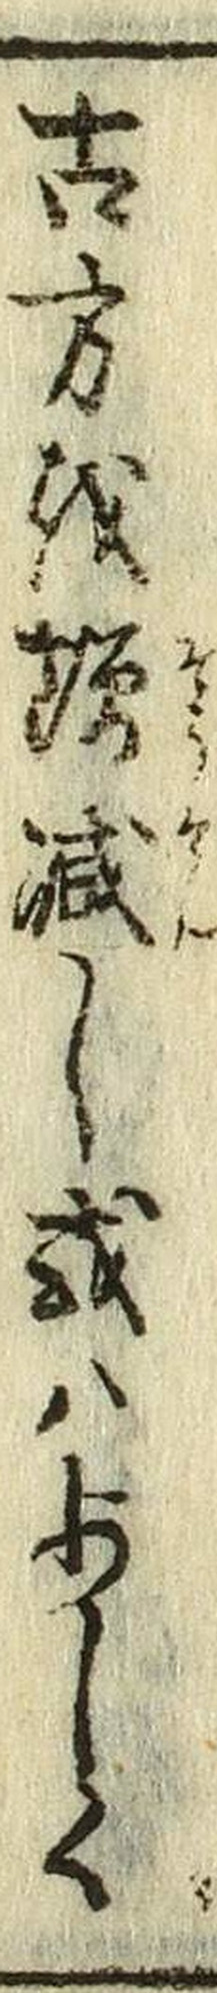古方を増減し或は少しく
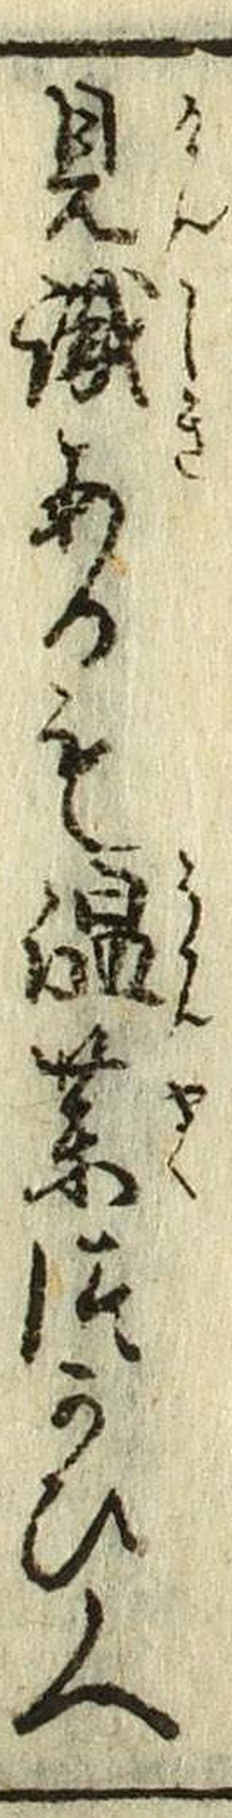見識あるも温薬つかひ人
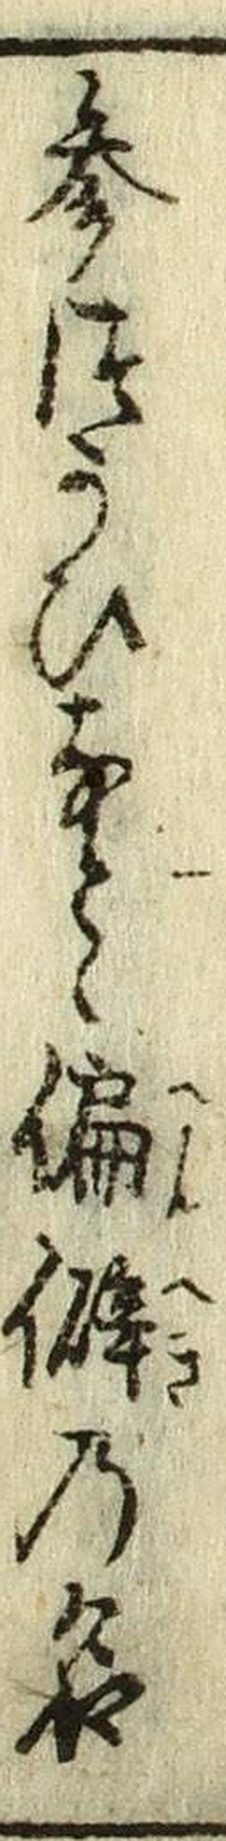参つかひなとゝ偏僻の名
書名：居家養生記
